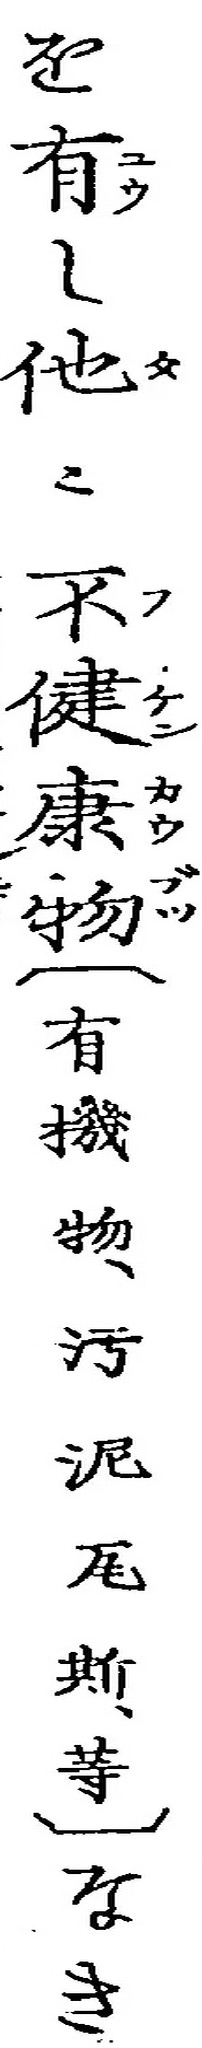を有し他に不健康物[有機物、汚泥瓦斯、等]なき
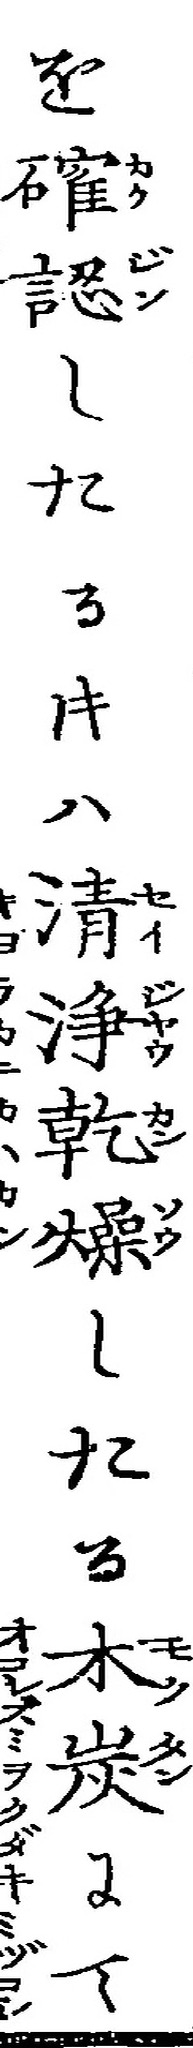を確認したるときは清浄乾燥したる木炭にて
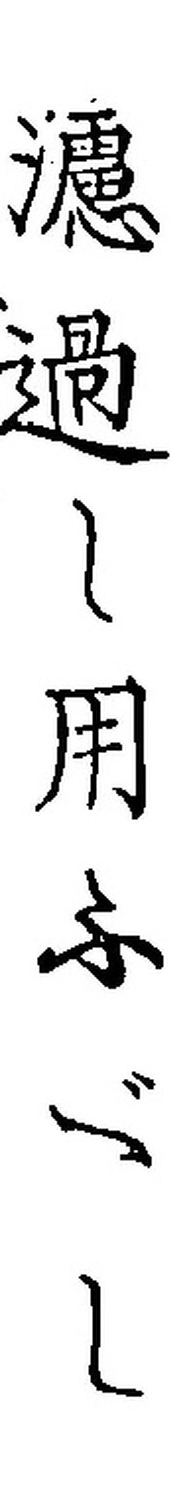濾過し用ふべし
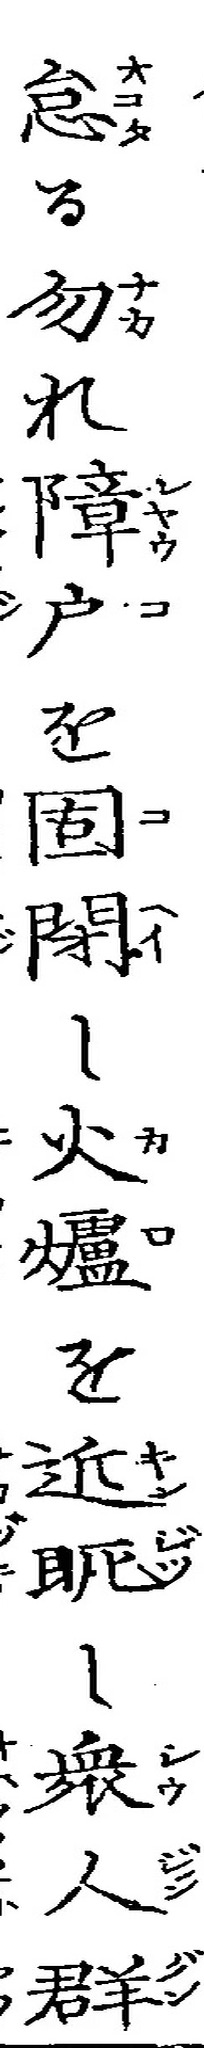怠る勿れ障戸を固閉し火爐を近昵し衆人群

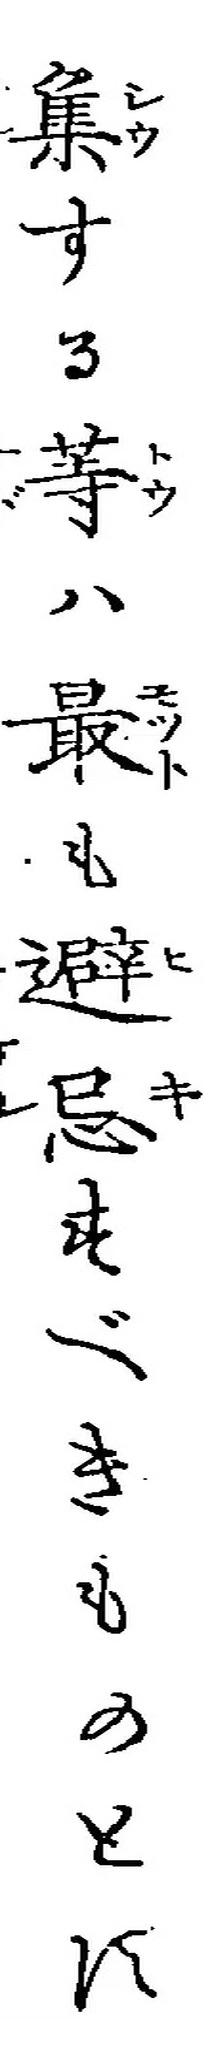集する等は最も避忌すべきものとす
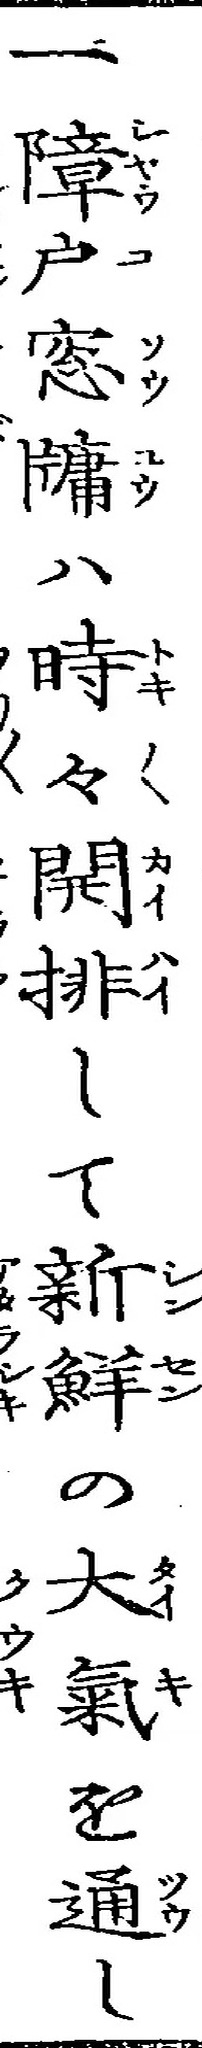一障戸窓牖は時々開排して新鮮の大気を通し
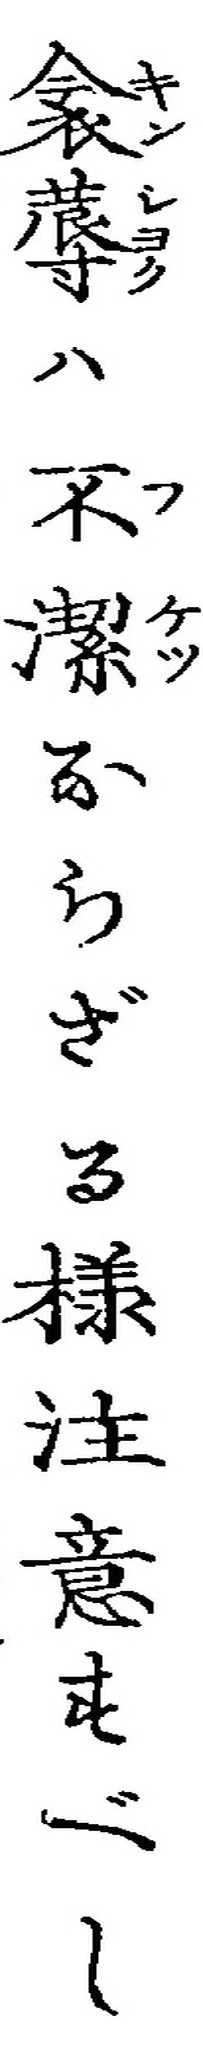衾蓐は不潔ならざる様注意すべし
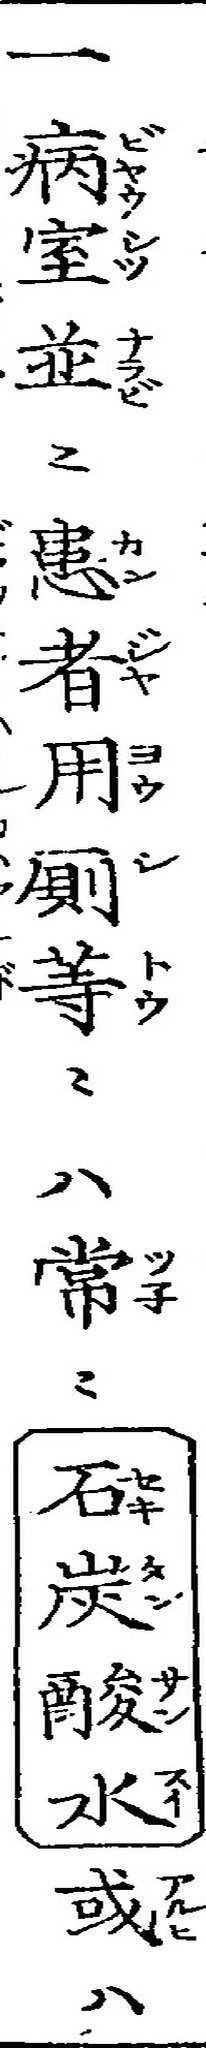一病室並に患者用厠等には常に「石炭酸水」或は
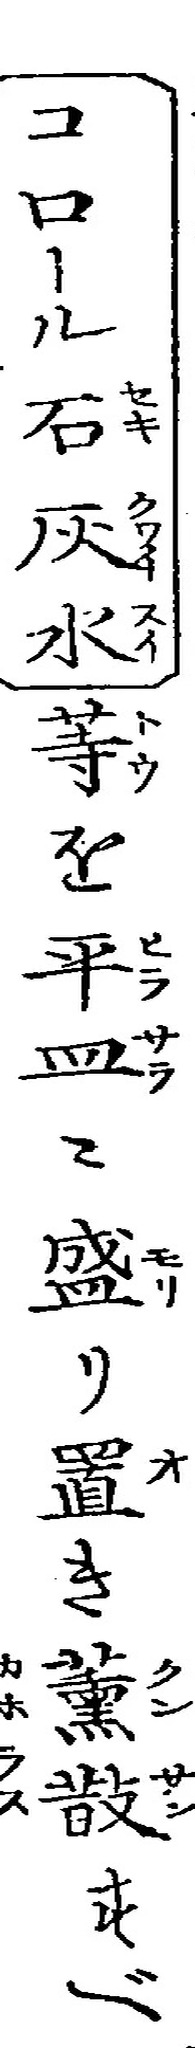「コロール石灰水等を平皿に盛り置き薫散すべ
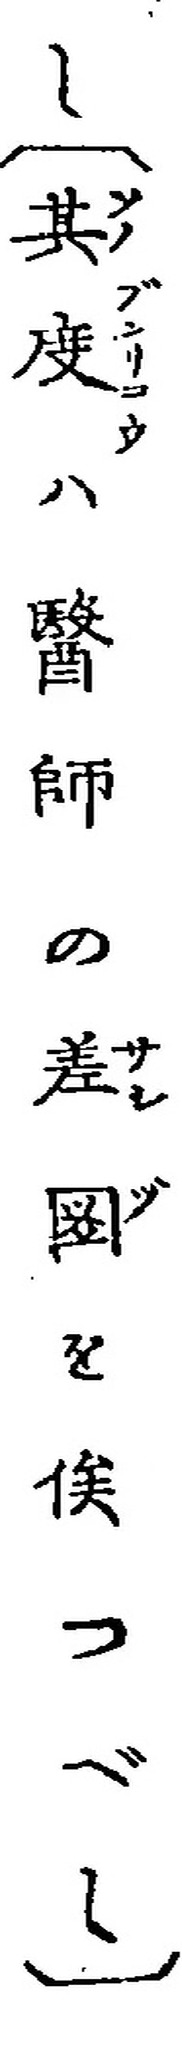し[其度は医師の差図を俟つべし]
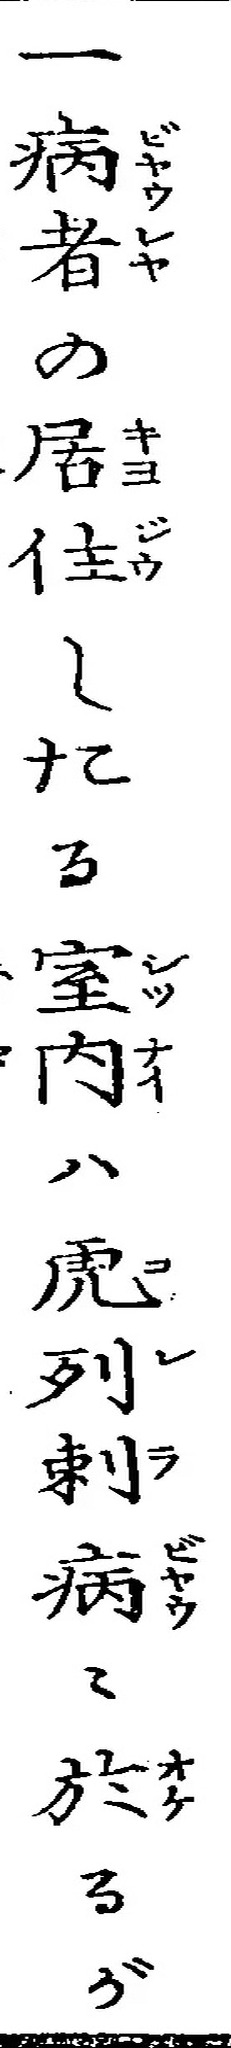一病者の居住したる室内は虎列刺病に於るが
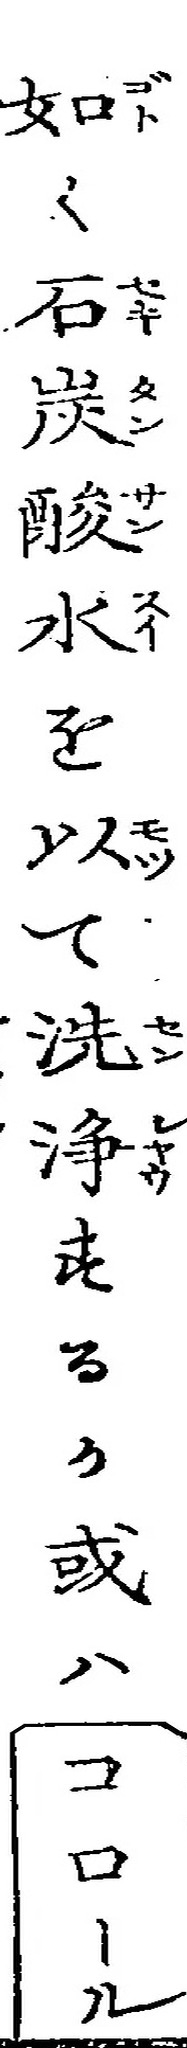如く石炭酸水を以て洗浄するか或は「コロール
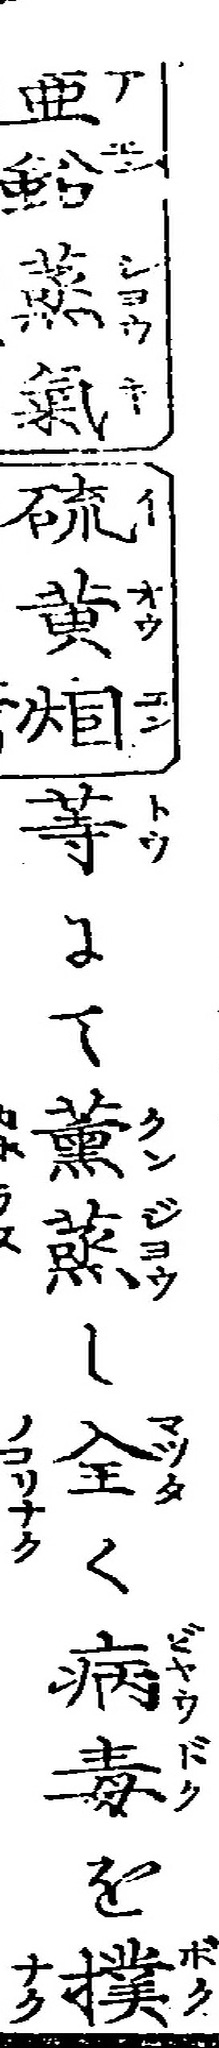亜鉛蒸気「硫黄煙」等にて燻蒸し全く病毒を撲
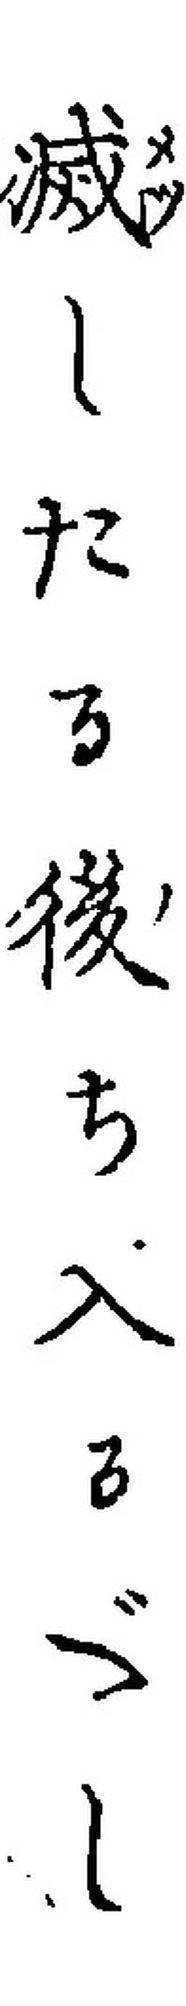滅したる後ち入るべし
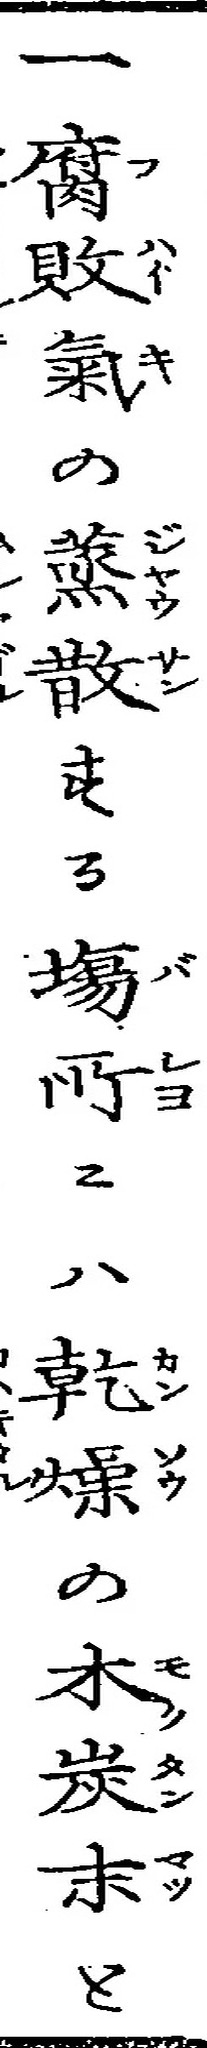一腐敗気の蒸散する場所には乾燥の木炭末と
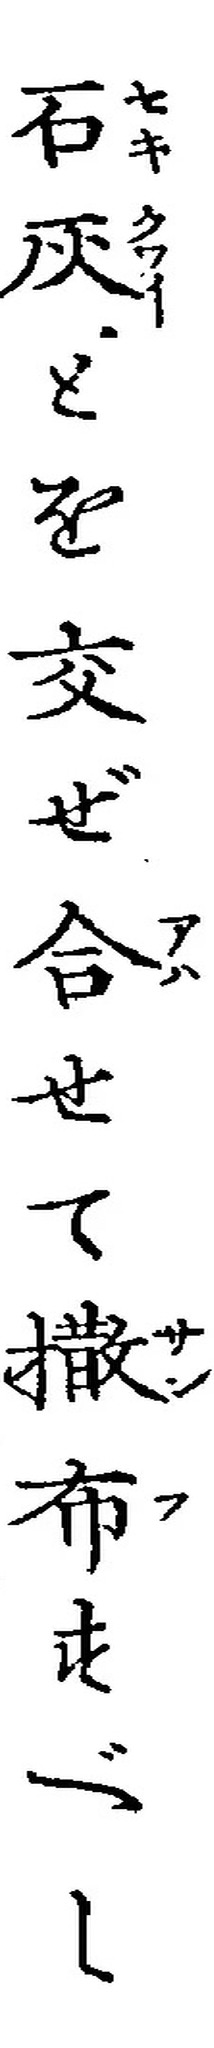石灰とを交ぜ合せて撒布すべし
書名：伝染病予防法
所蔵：国立国会図書館 National Diet Library, JAPAN
